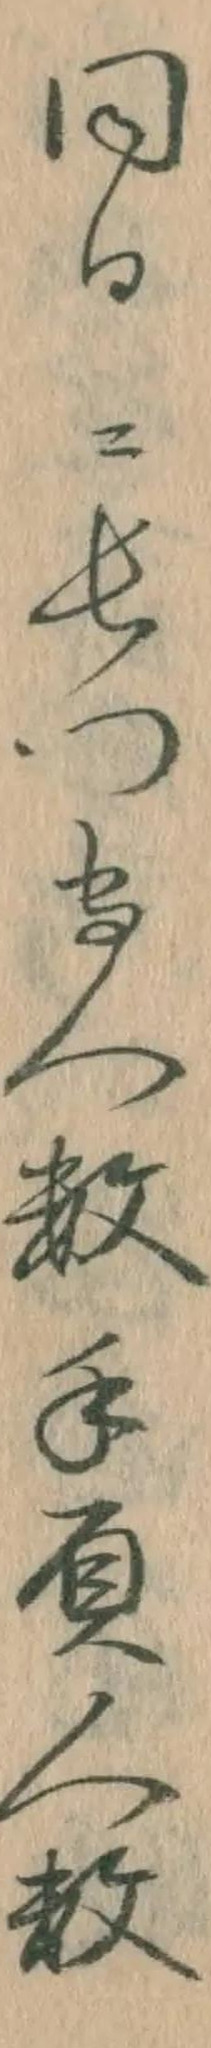同日に長門守人数手負人数
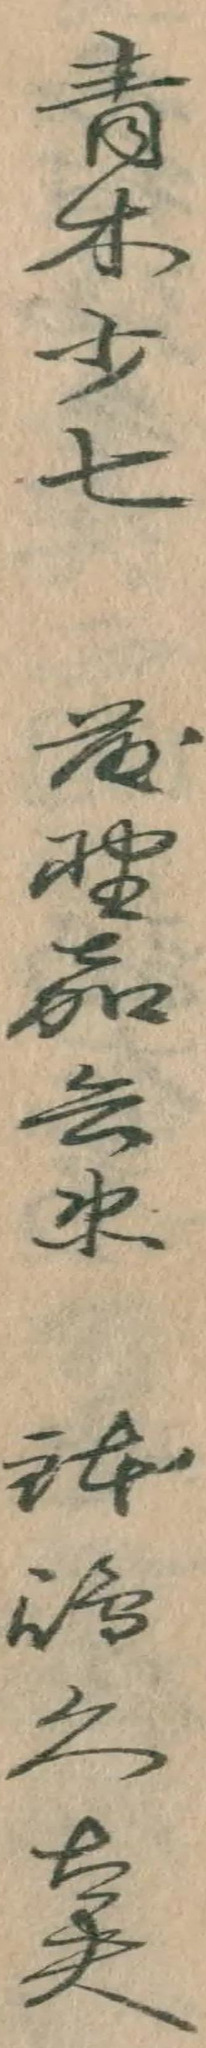青木少七藤野嘉兵衛鉢島久太夫
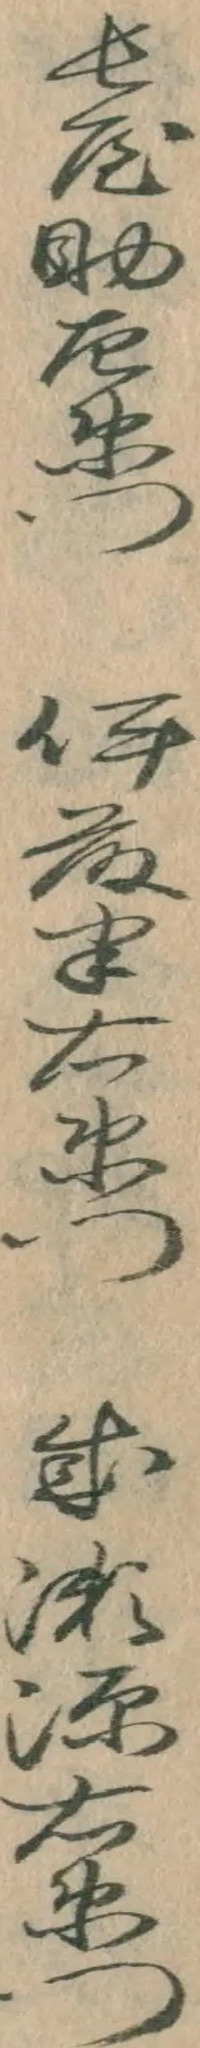長屋助左衛門伊藤半右衛門成瀬源右衛門
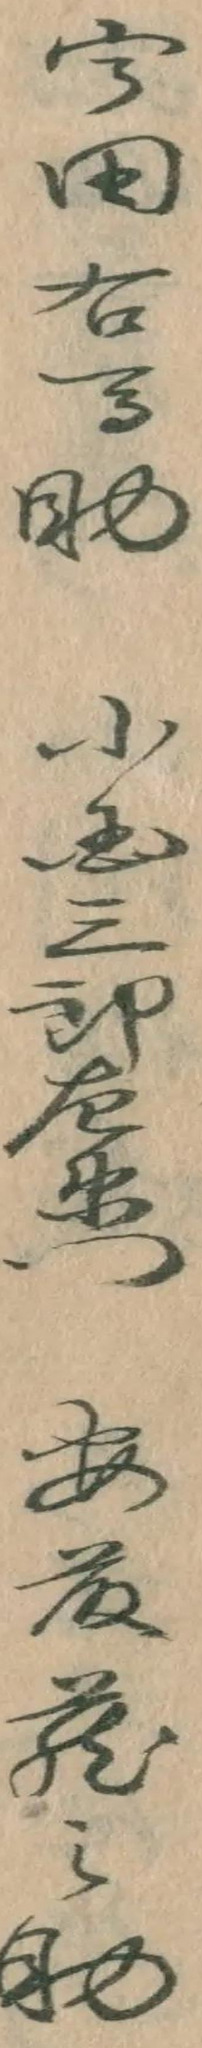宇田右馬助小国三郎左衛門安藤蔵之助
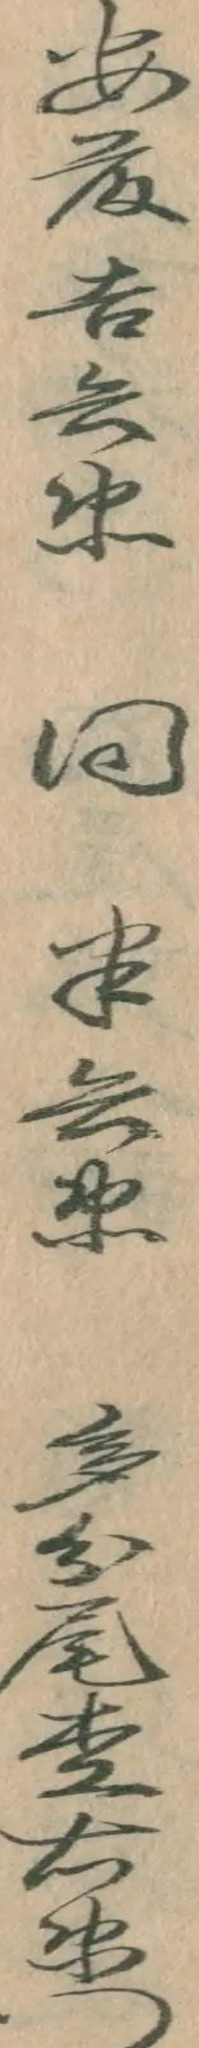安藤吉兵衛同半兵衛多分尾杢右衛門
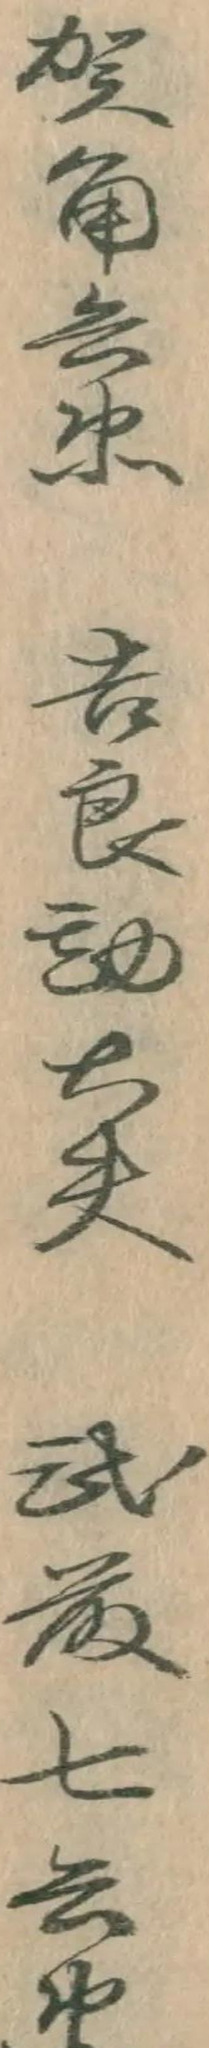千賀角兵衛吉良勘太夫武藤七兵衛

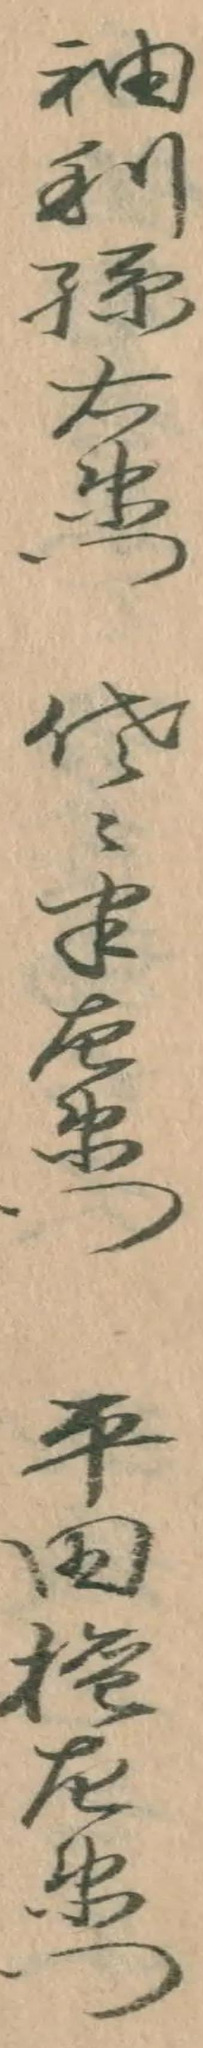袖利孫右衛門佐々半左衛門平田権左衛門
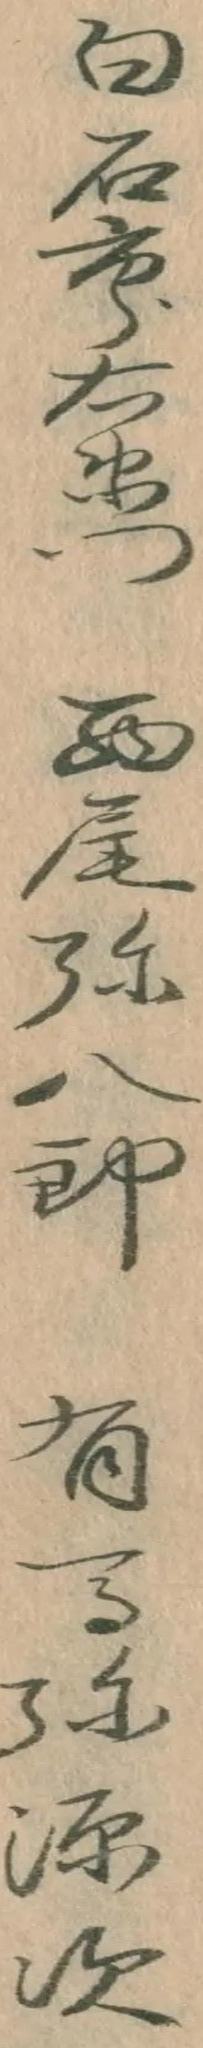白石市郎右衛門西尾弥八郎有馬弥源次
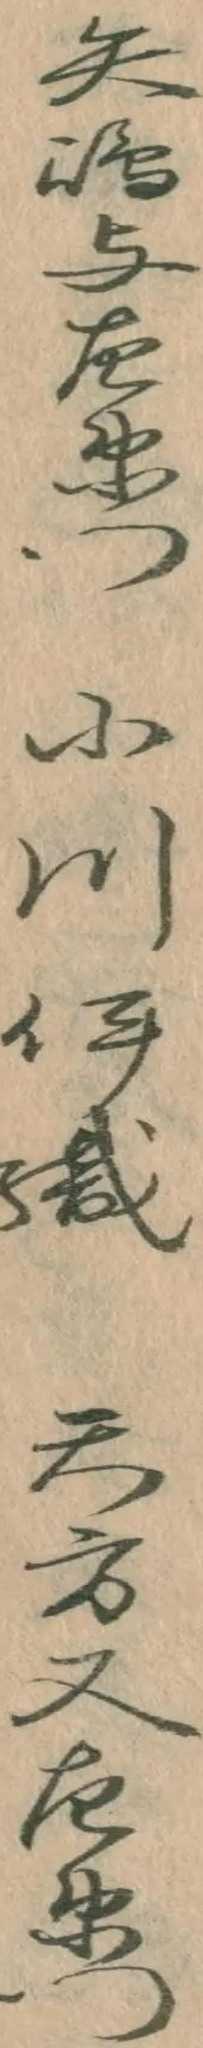矢島与左衛門小川伊織天方又左衛門
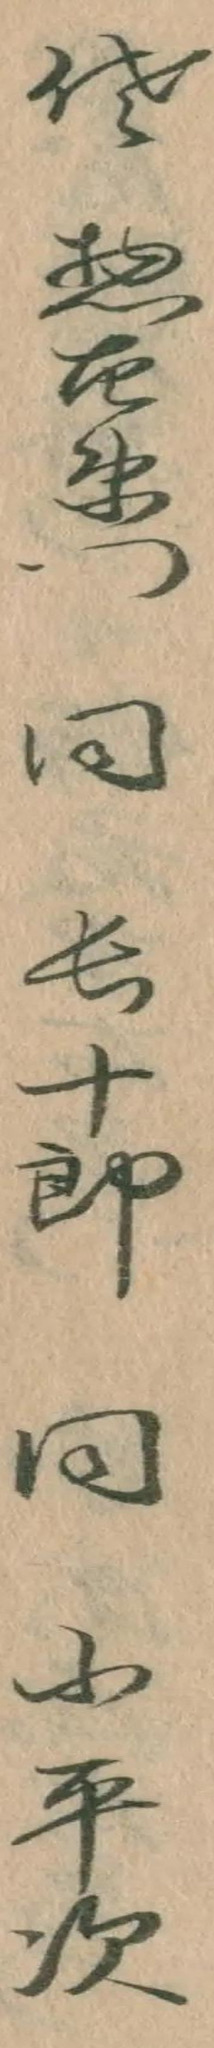佐惣左衛門長長十郎同小平次
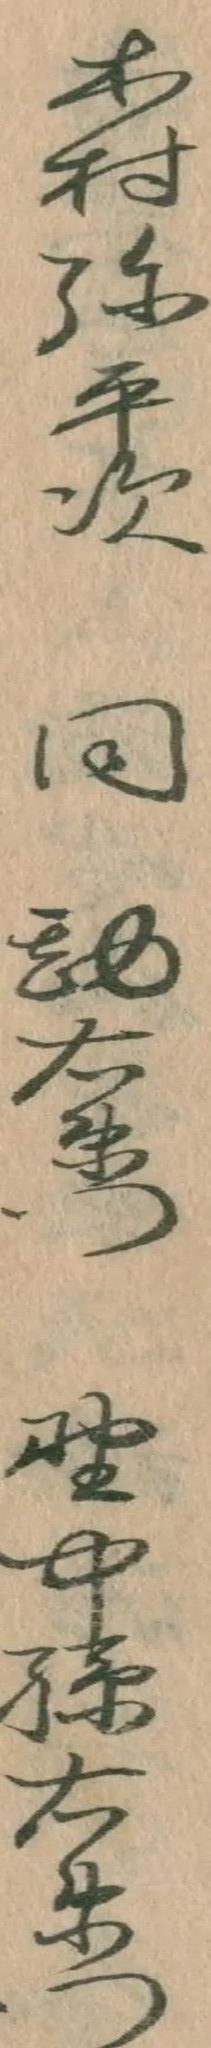木村弥平次同勘右衛門野中孫右衛門
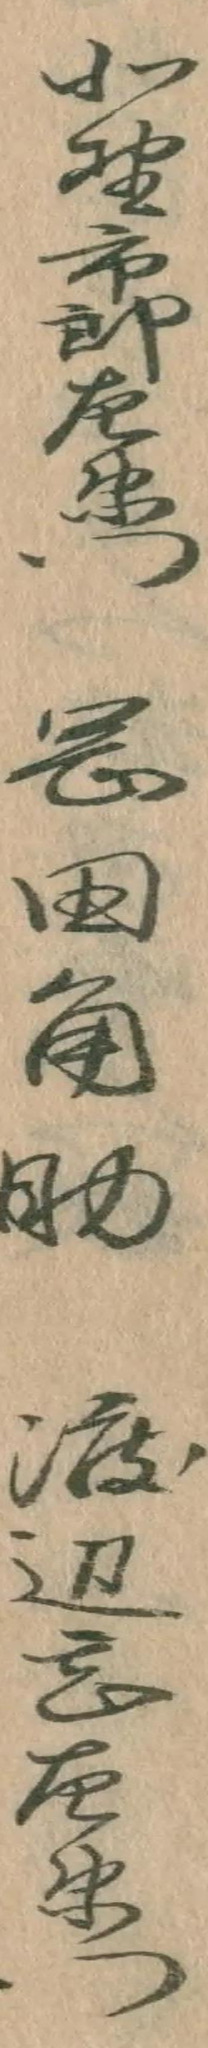北野市郎左衛門岡田角助渡辺甚左衛門
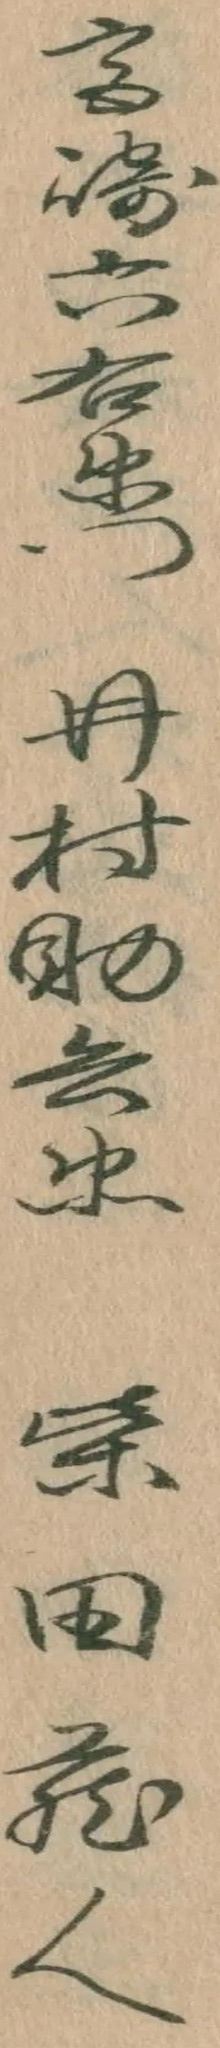宮崎六右衛門井村助兵衛柴田蔵人
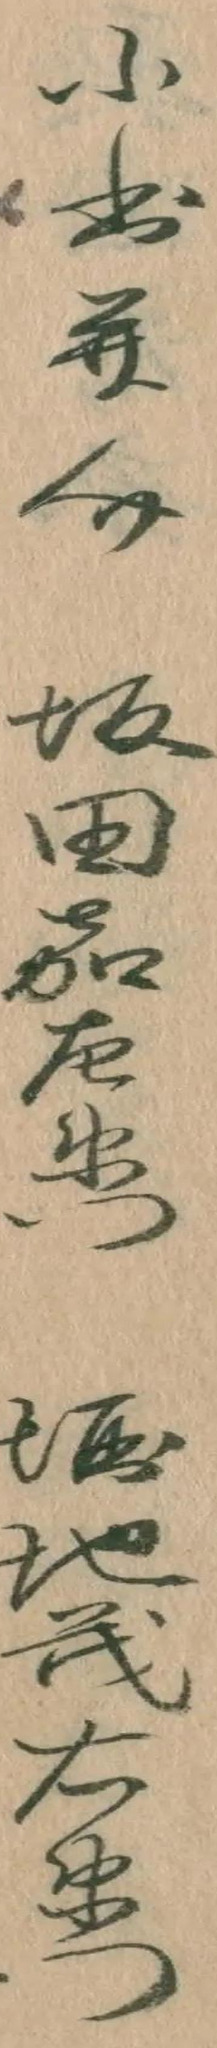小出并介坂田嘉左衛門堀地茂右衛門
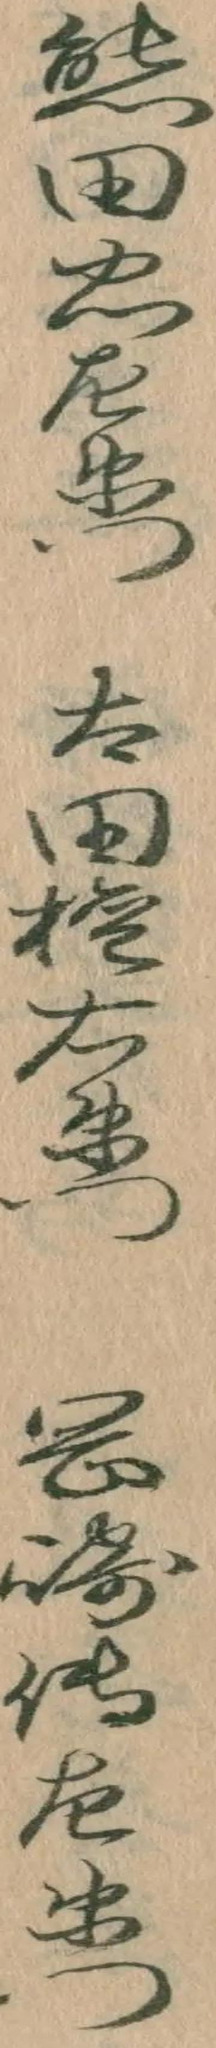熊田忠左衛門太田権右衛門岡崎伝左衛門
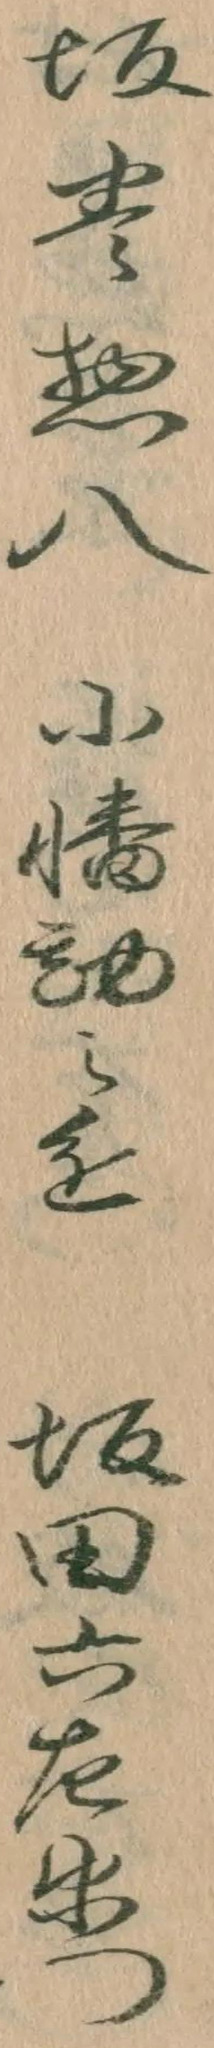坂巻惣八小幡勘之進坂田六左衛門
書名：切支丹御退治記 49巻. [5]
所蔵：国立国会図書館 National Diet Library, JAPAN
